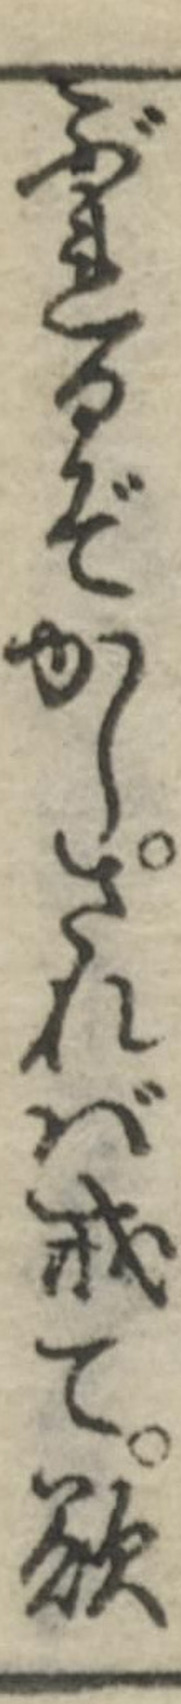ぶれるぞかし。されば戒て。欲
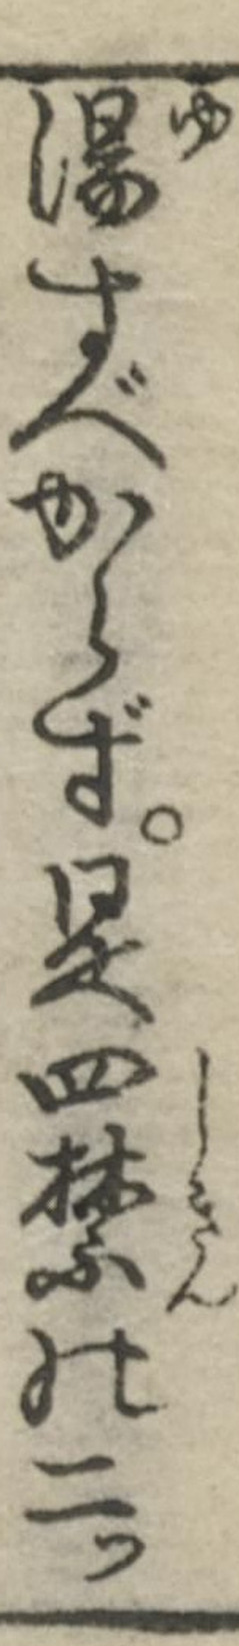湯すべからず。是四禁の二つ
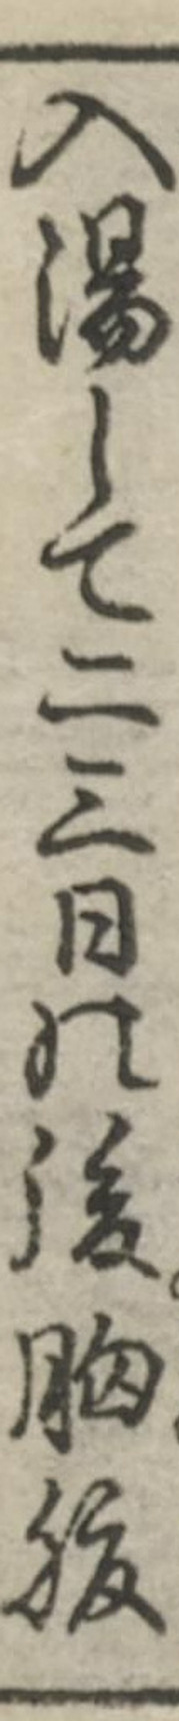入湯して二三日の後。胸腹
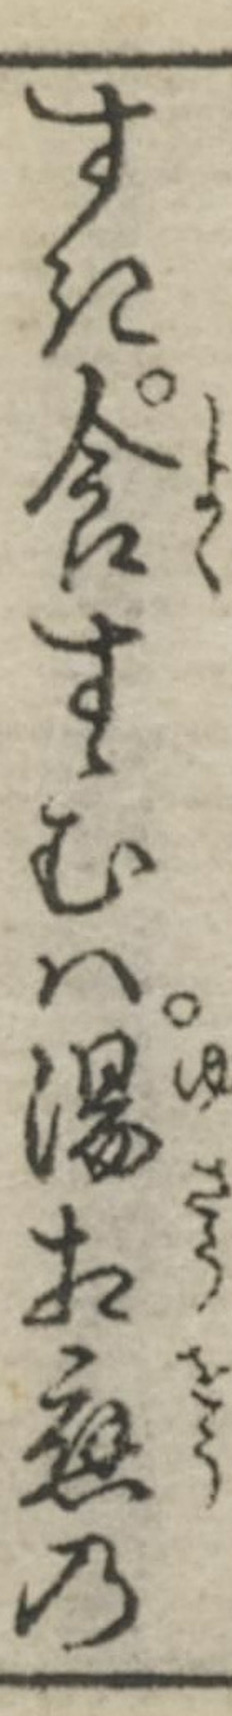すき。食すゝむは。湯相応の
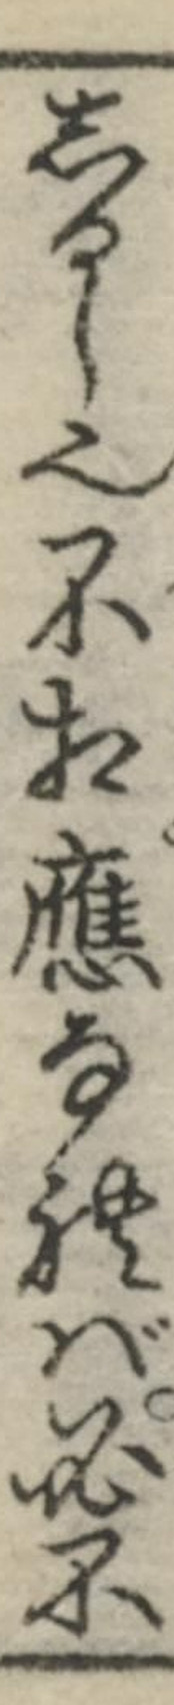しるし也。不相応なれば。必不
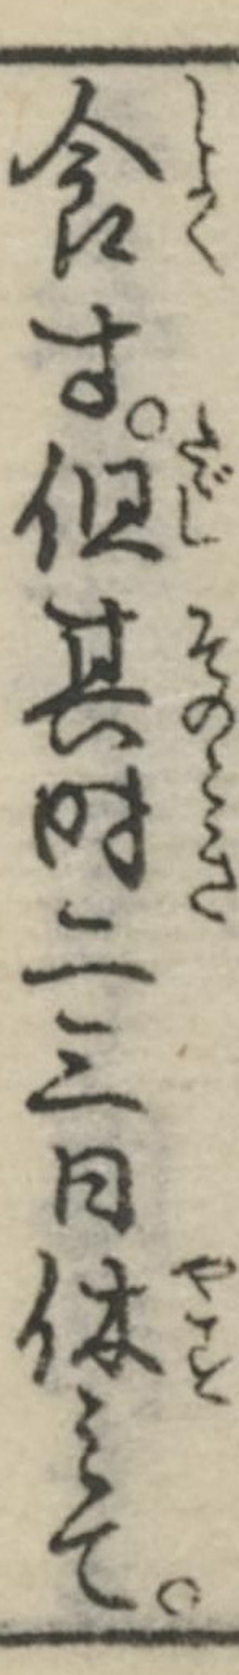食す。但其時二三日休みて。
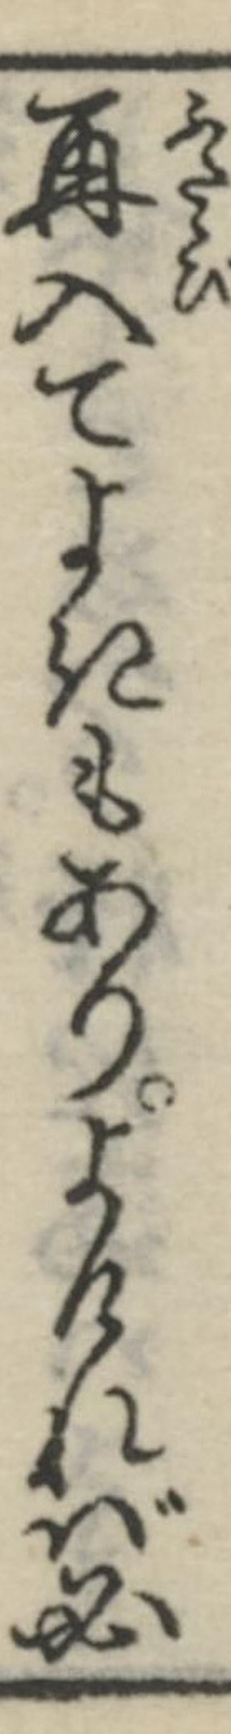再入てよきもあり。よければ必
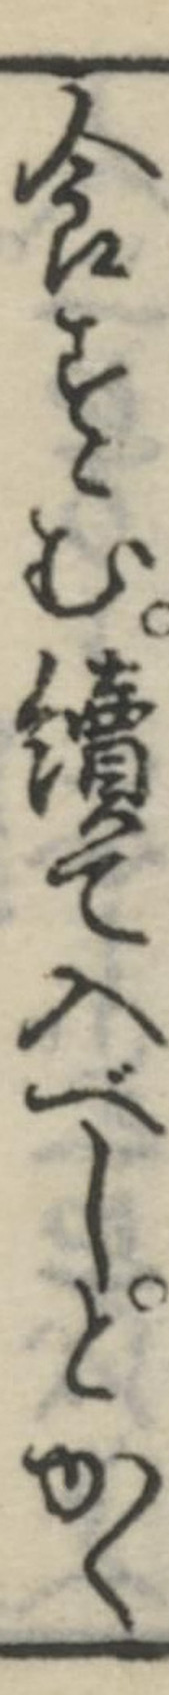食すゝむ。続て入べし。とかく
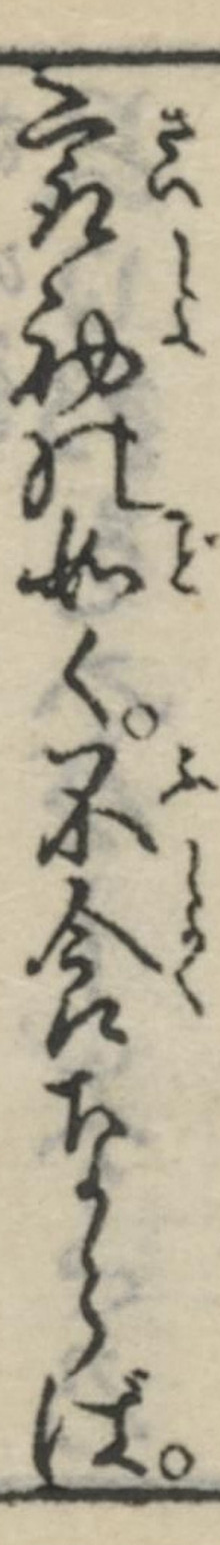最初の如く。不食ならば。
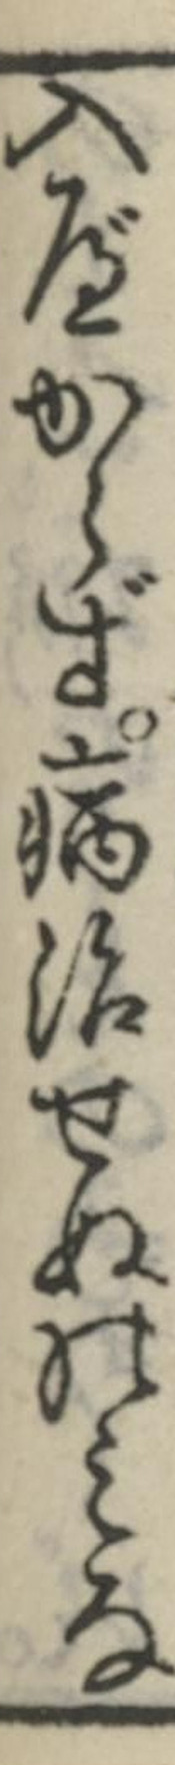入べからず。病治せぬのみな
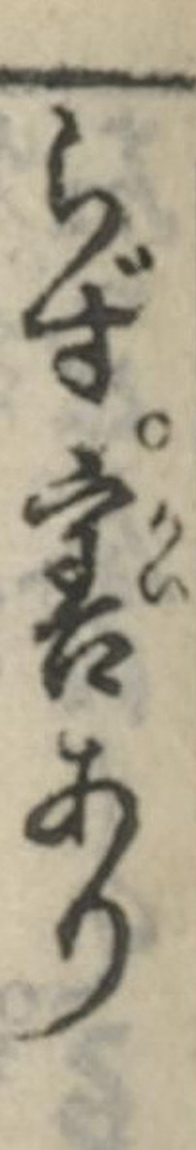らず。害あり
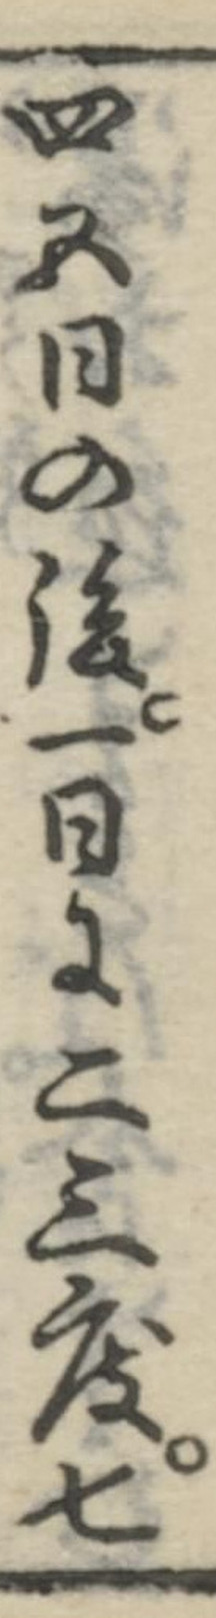四五日の後。一日に二三度。七
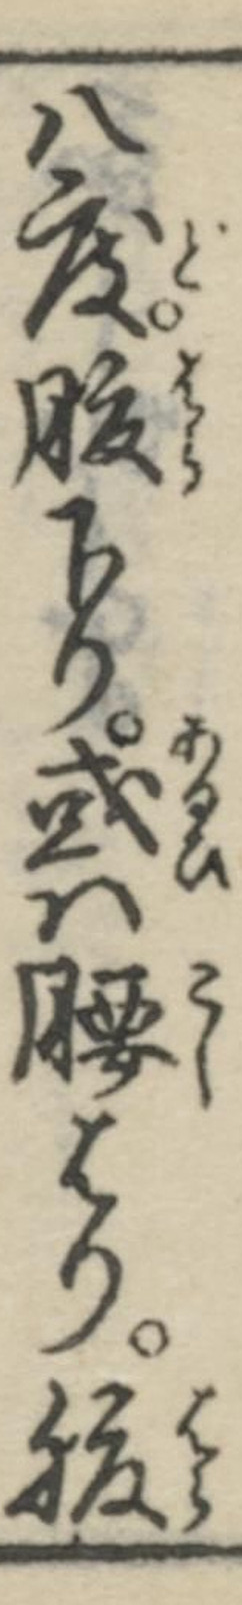八度。腹下り。或は腰はり。腹
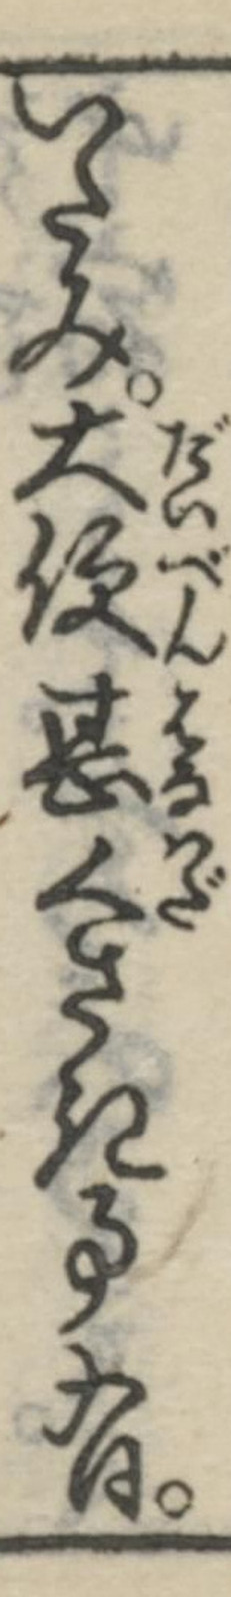いたみ。大便甚くさき事有。
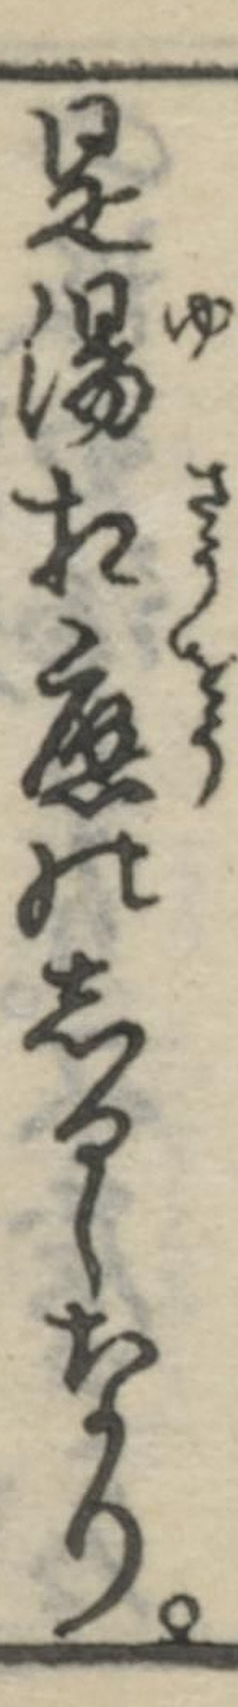是湯相応のしるしなり。
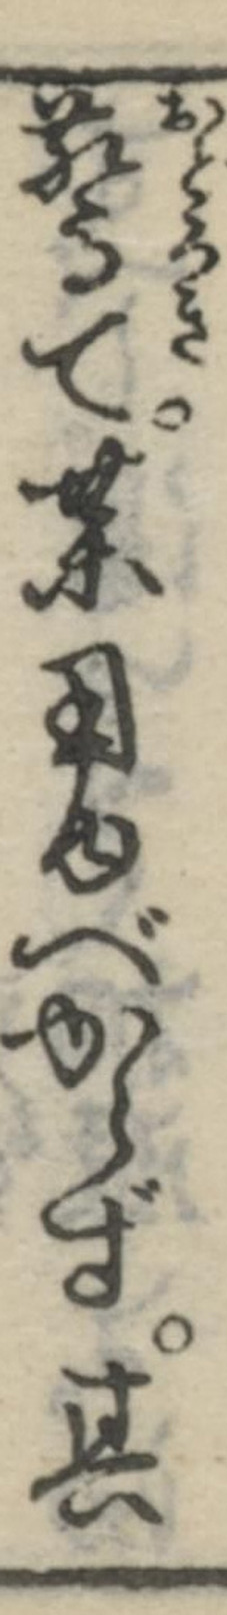驚て。薬用ゆべからず。其
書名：但州城崎浴湯辧
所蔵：東京大学地震研究所図書室 Earthquake Research Institute Library, The University of Tokyo, JAPAN
